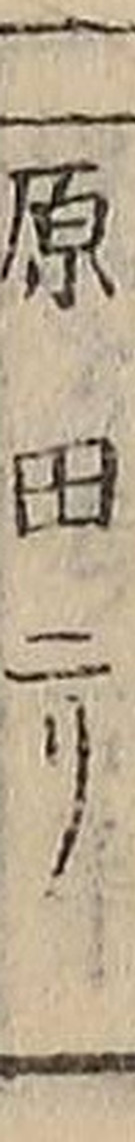原田二リ
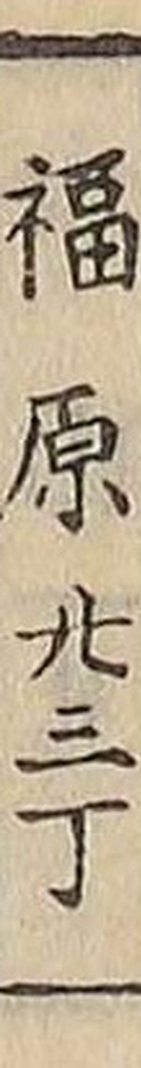福原廿三丁
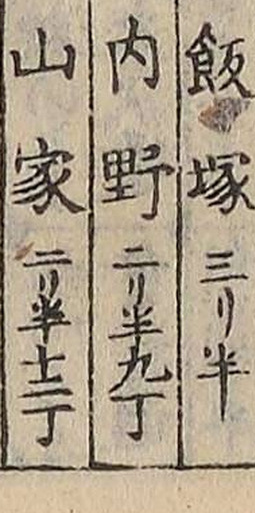山家二リ半十二丁
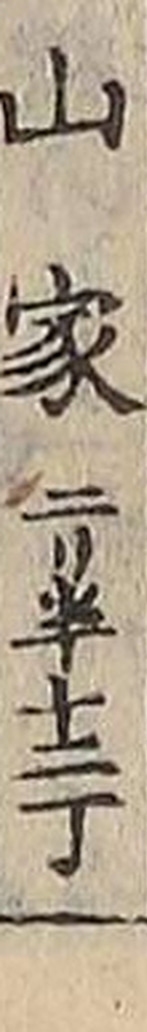山家二リ半十二丁
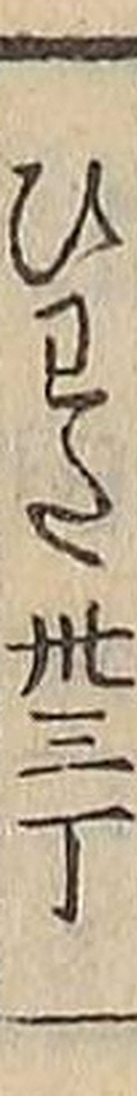ひわた卅三丁
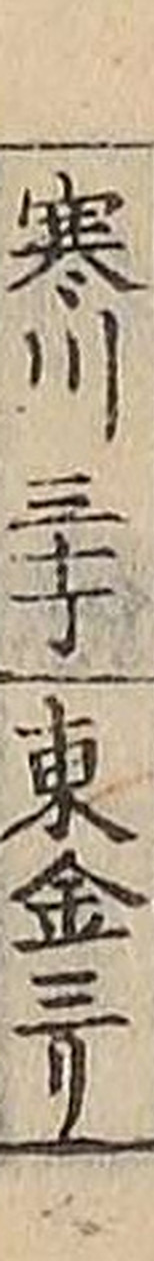寒川三十丁東金三リ
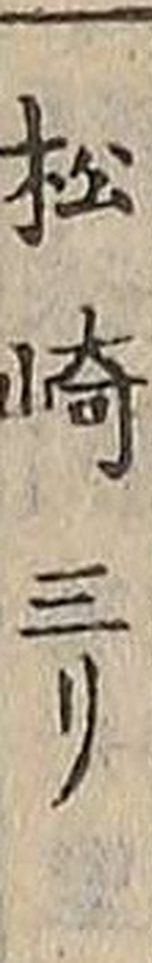松崎三リ
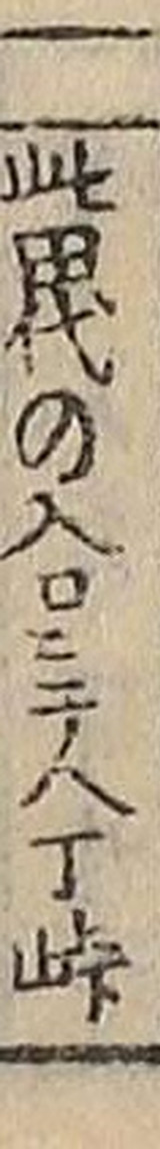此田代の入口ニテ八丁峠
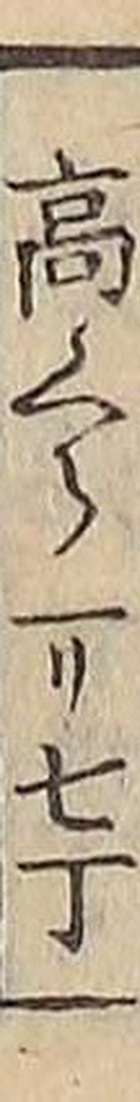高くら一リ七丁
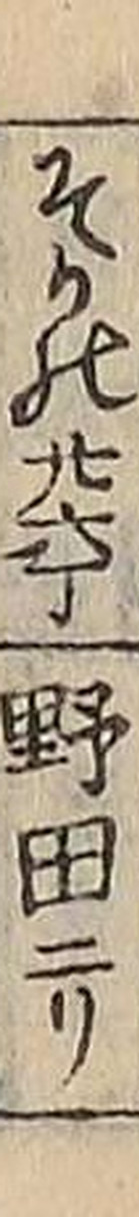そかの廿六丁野田二リ
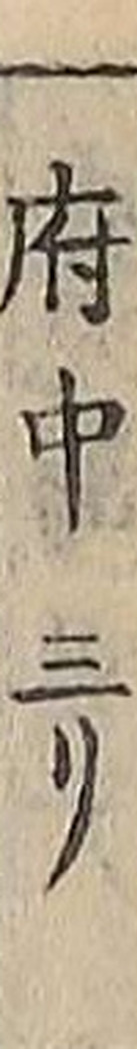府中三リ
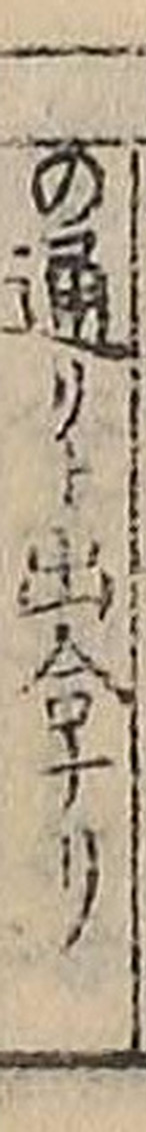の通リト出合ナリ
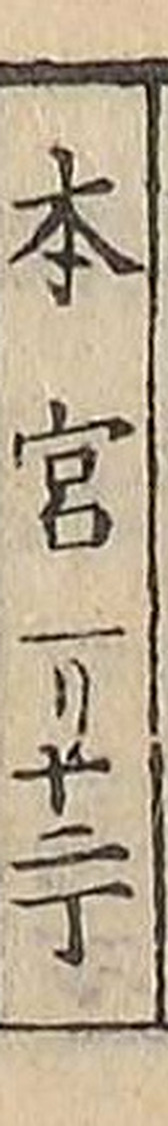本宮一リ十二丁
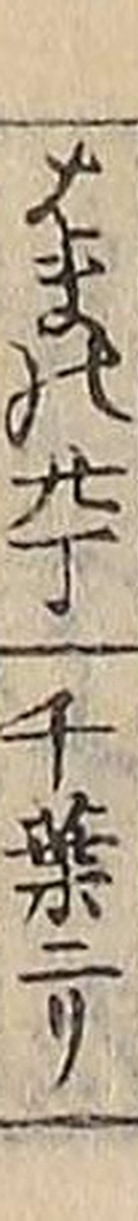はまの廿丁千葉二リ
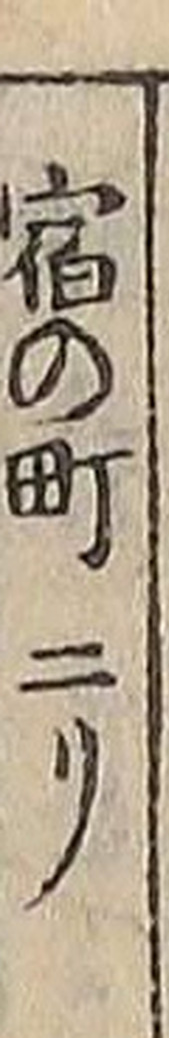宿の町二リ
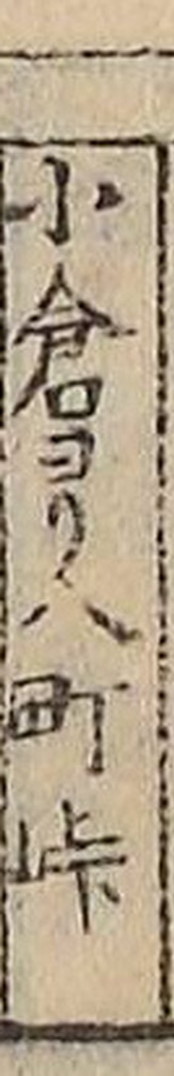小倉ヨリ八町峠
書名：旅行用心集
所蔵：神戸大学附属図書館 国文学研究資料館
